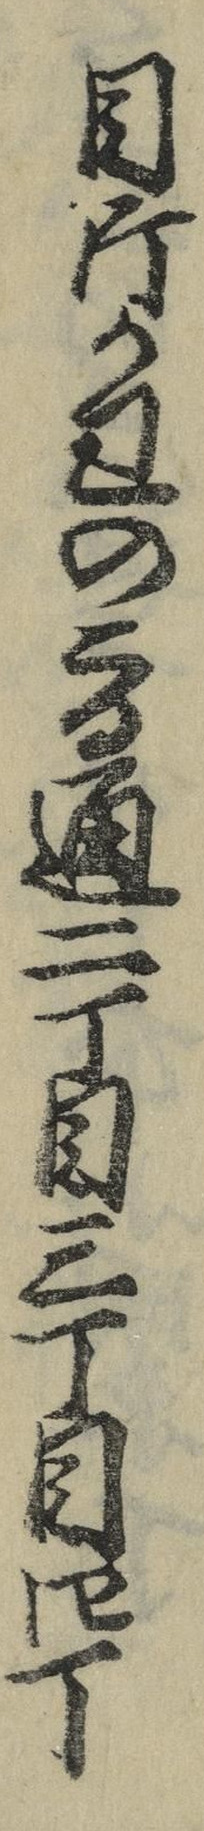目片かわのこる通二丁目三丁目四丁
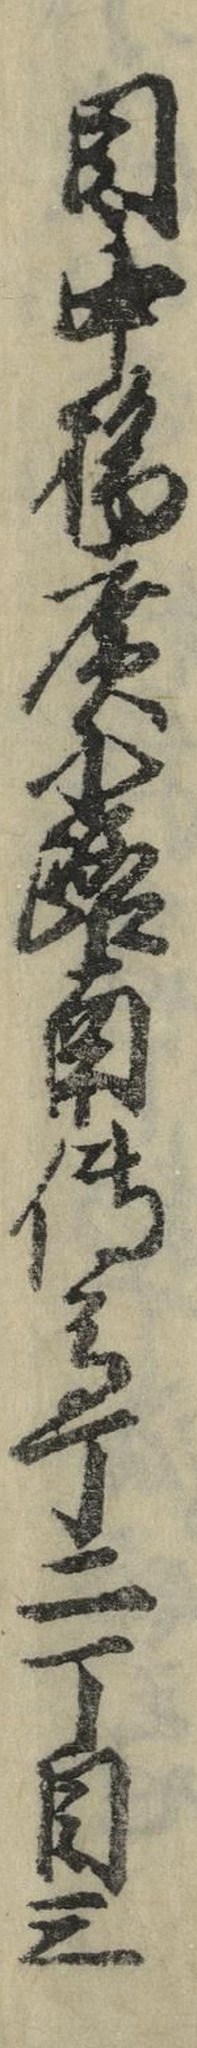目中橋広小路南伝馬丁二丁目三
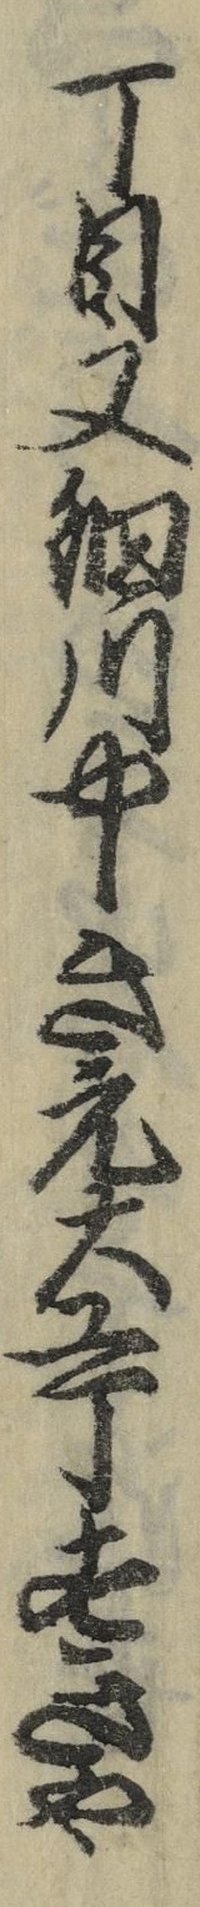丁目又細川やしき元大工丁すきや
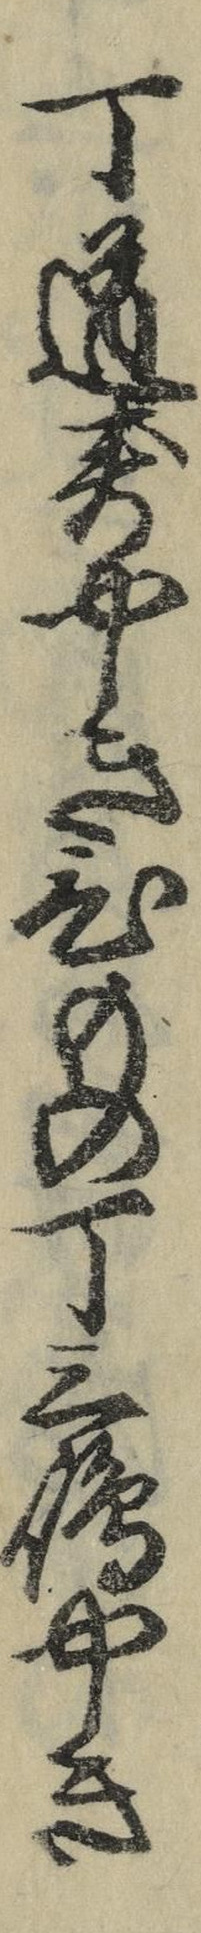丁道寿やしきひもの丁三嶋やしき
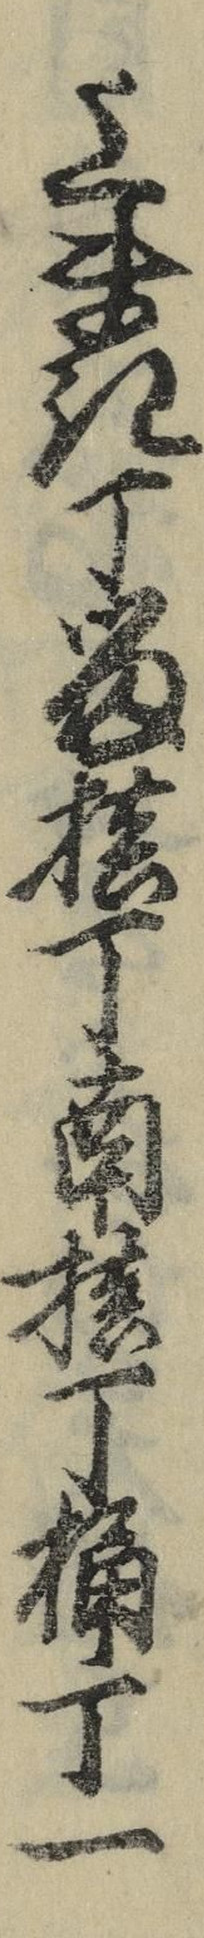上まき丁留横丁南横丁桶丁一
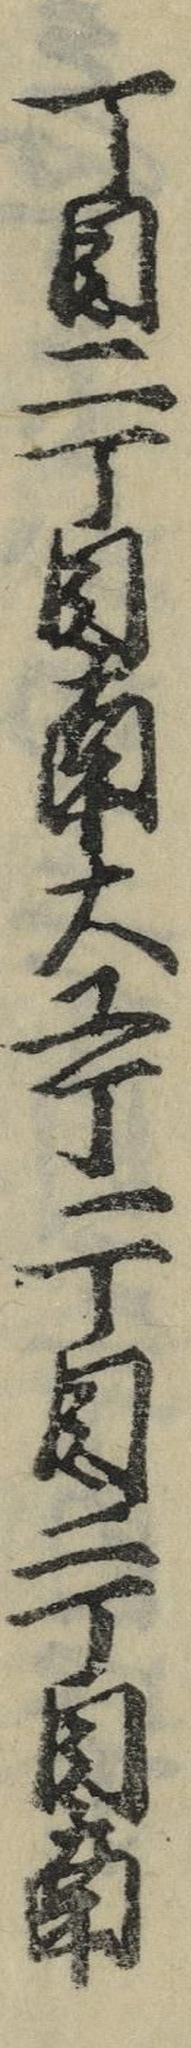丁目二丁目南大衛一丁目二丁目南
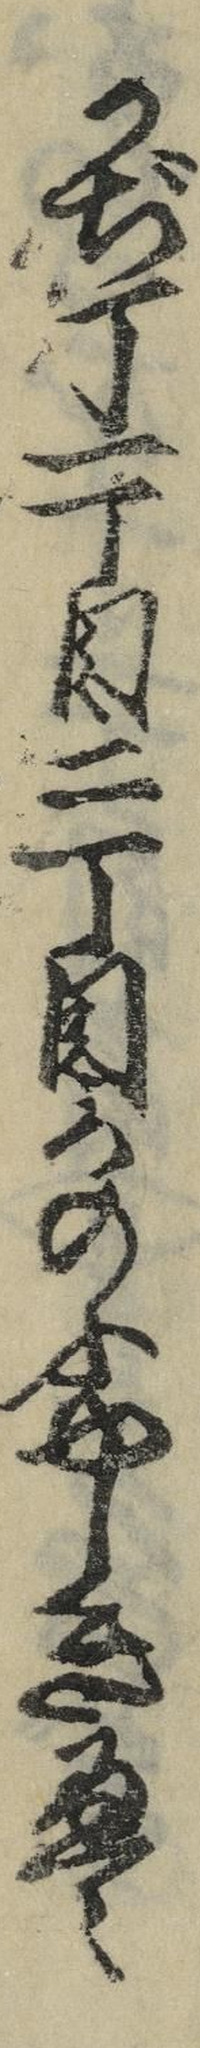つぢ丁一丁目二丁目かのふやしき畳
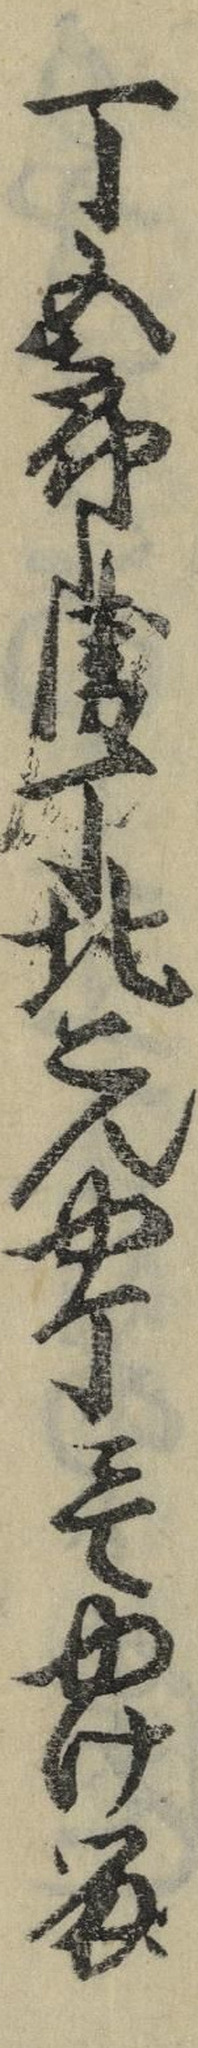丁五郎兵衛丁北こんや丁二てやけ留
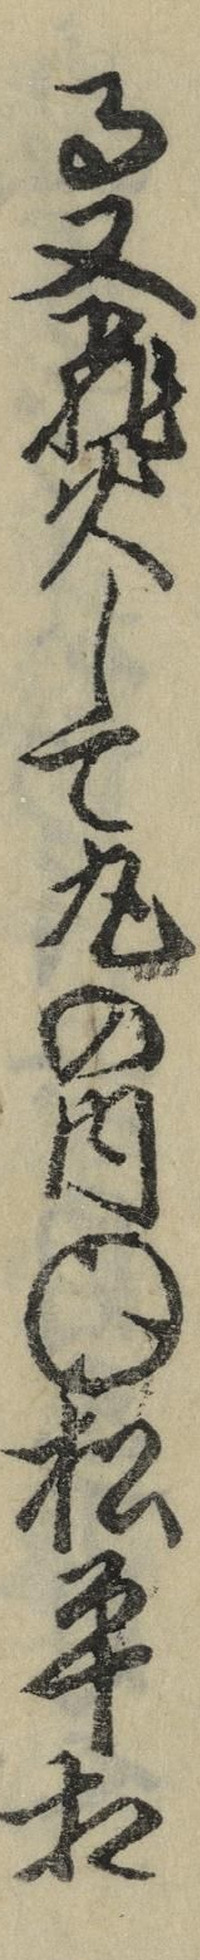る又飛火して丸の内○松平相
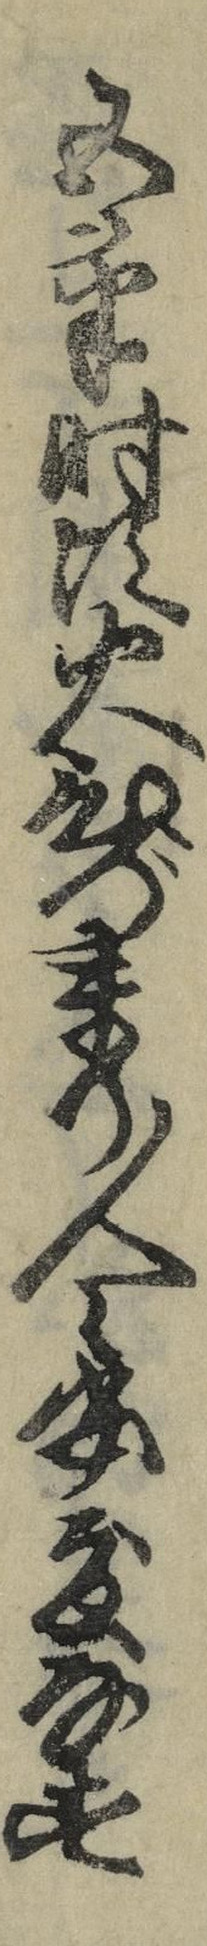五ツ半時頃火ひづまり人々安度なす
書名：大江戸焼場所明細之写　附出火方角画圖　戊午安政五年十一月十五日
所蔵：東京大学地震研究所図書室 Earthquake Research Institute Library, The University of Tokyo, JAPAN
